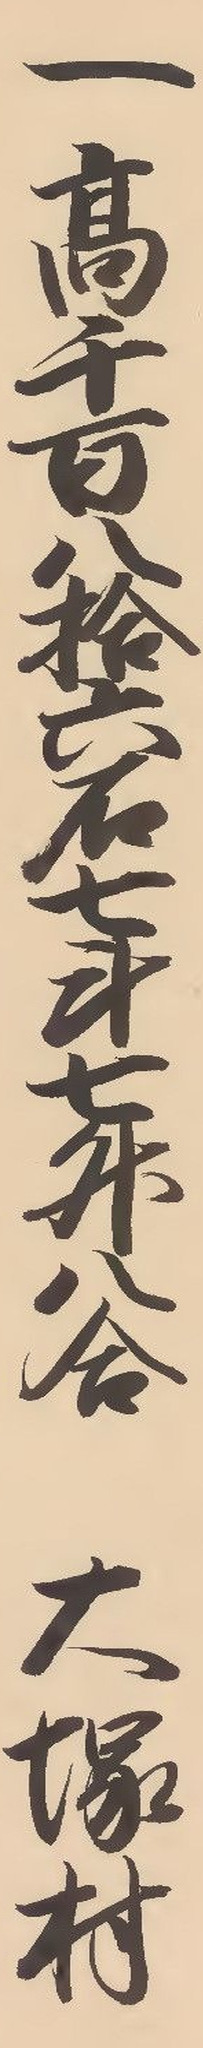一高千百八拾六石七斗七升八合大塚村
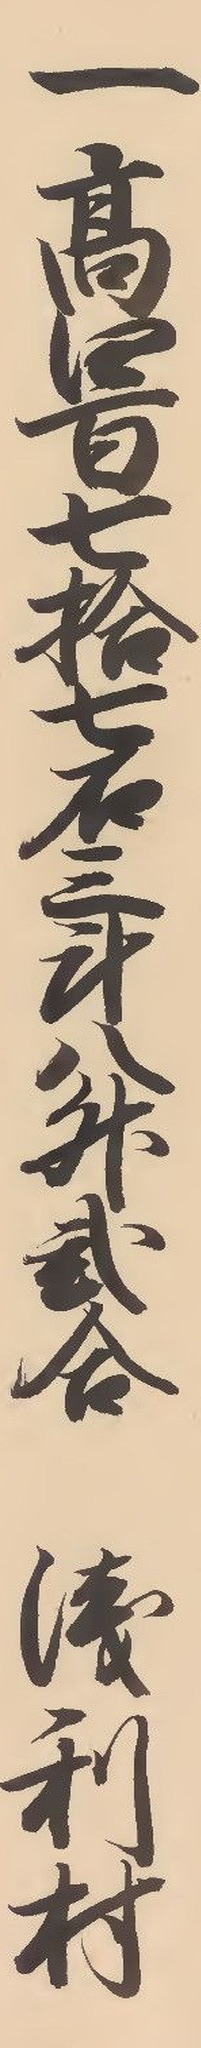一高四百七拾七石三斗八升弐合浅利村
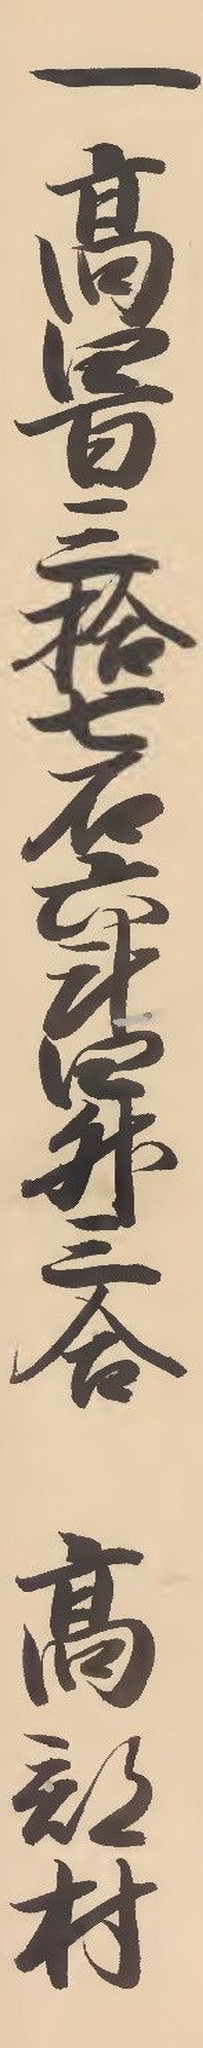一高四百三拾七石六斗四升三合高部村
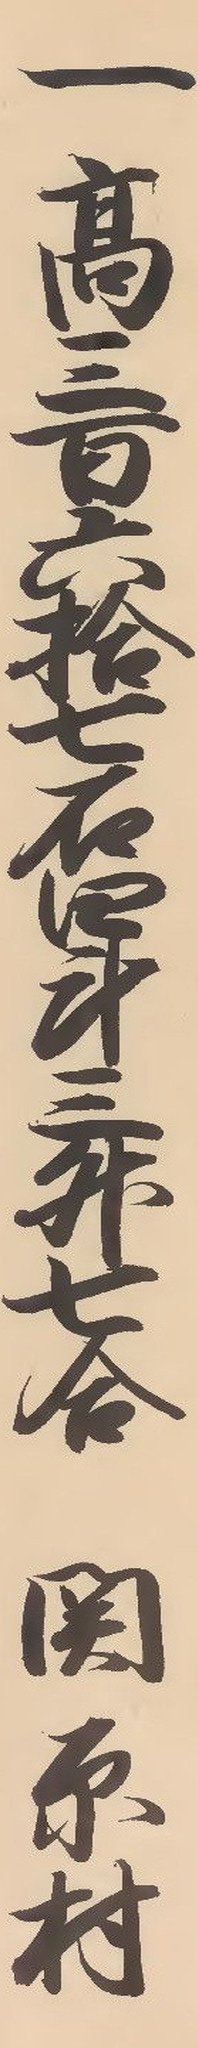一高三百六拾七石四斗三升七合関原村
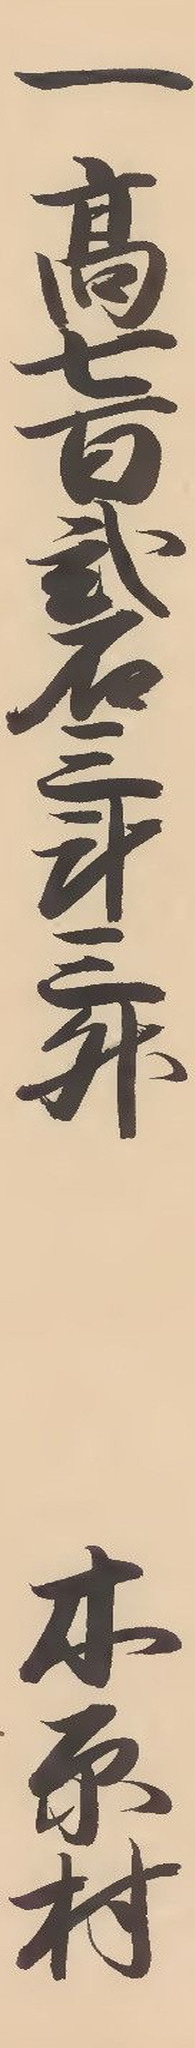一高七百弐石三斗三升木原村
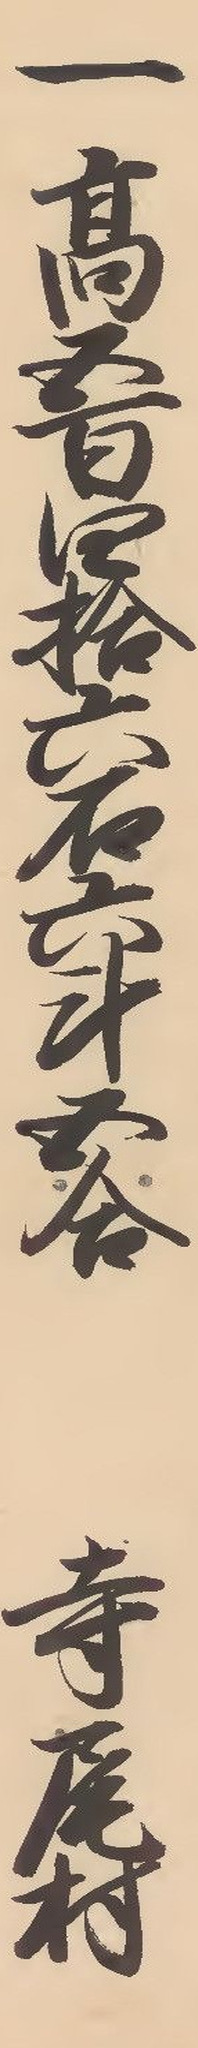一高五百四拾六石六斗五合寺尾村

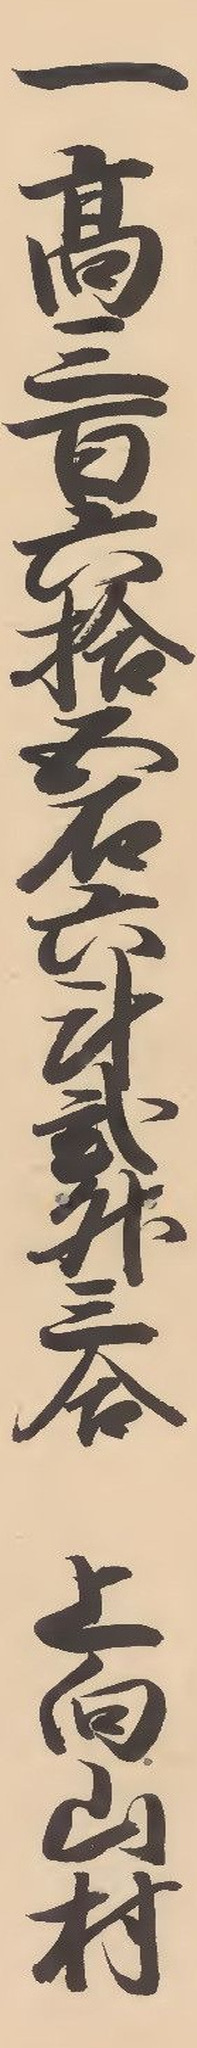一高三百六拾五石六斗弐升三合上向山村
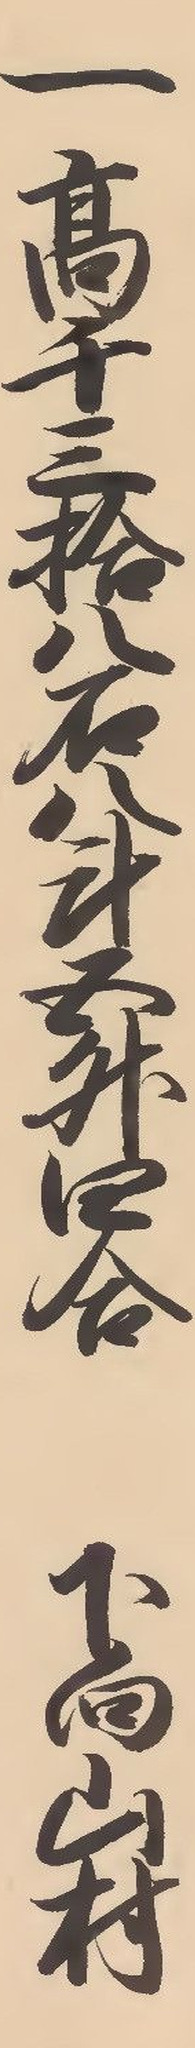一高千三拾八石八斗五升四合下向山村
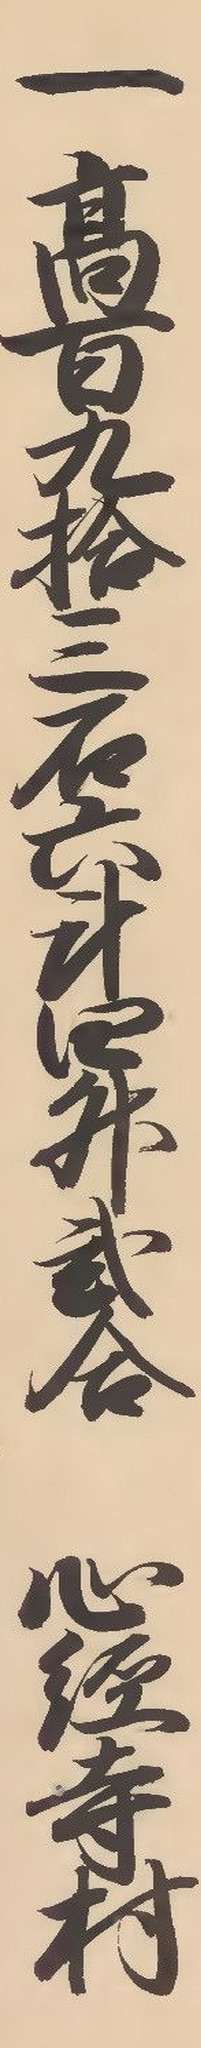一高百九拾三石六斗四升弐合心経寺村
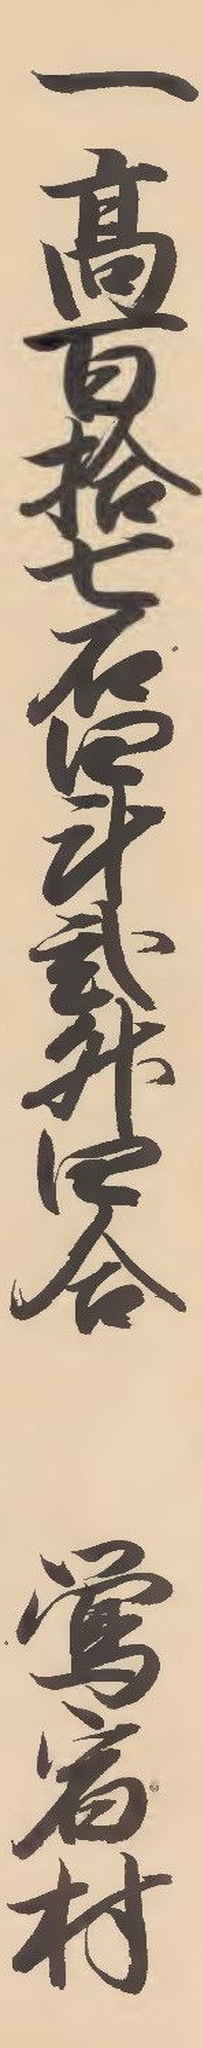一高百拾七石四斗弐升四合鴬宿村
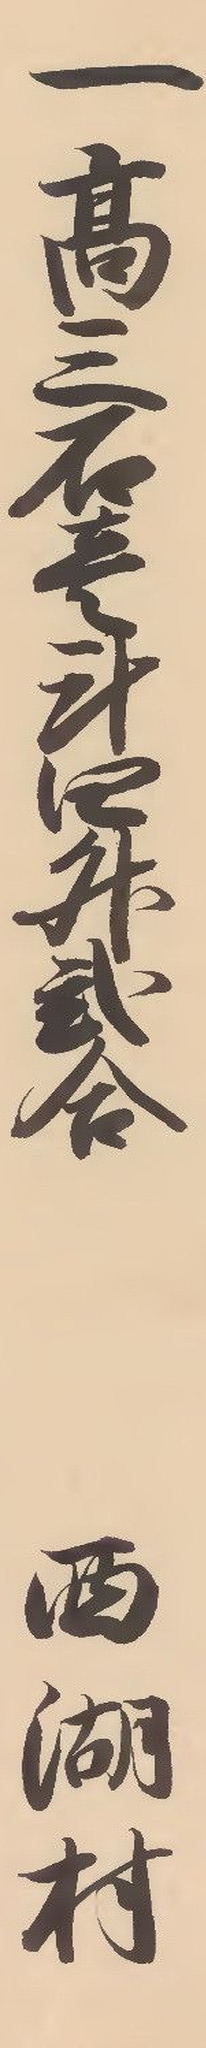一高三石壱斗四升弐合西湖村
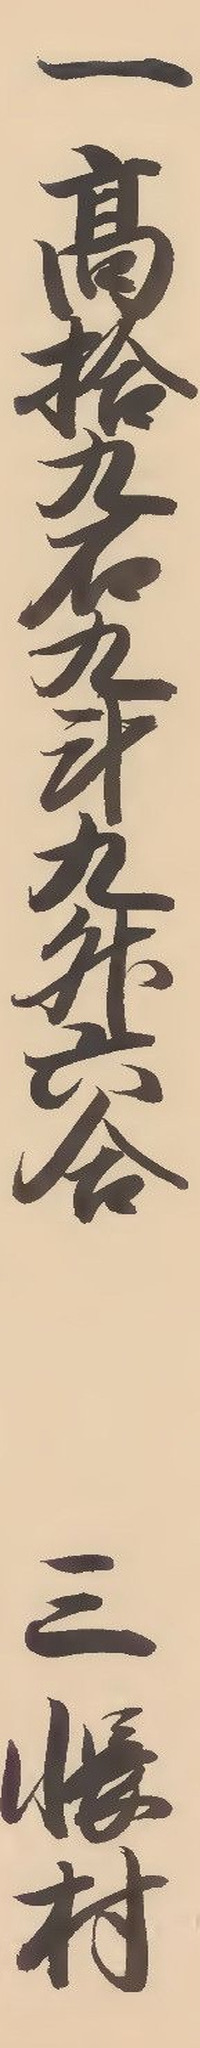一高拾九石九斗九升六合三帳村
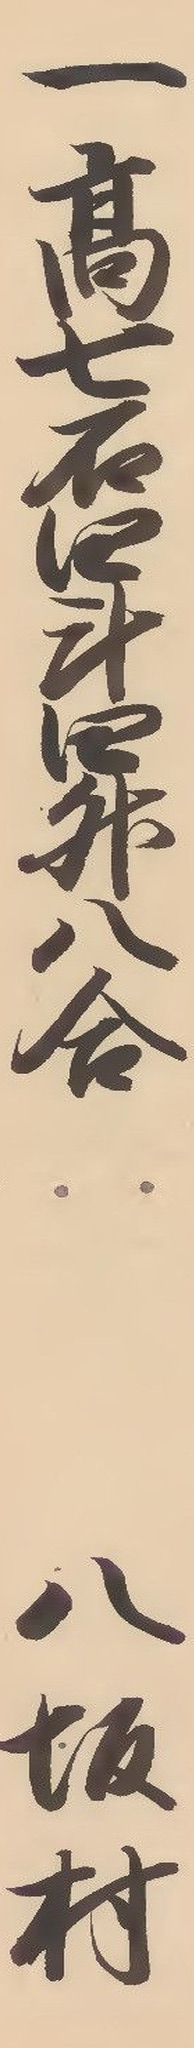一高七石四斗四升八合八坂村

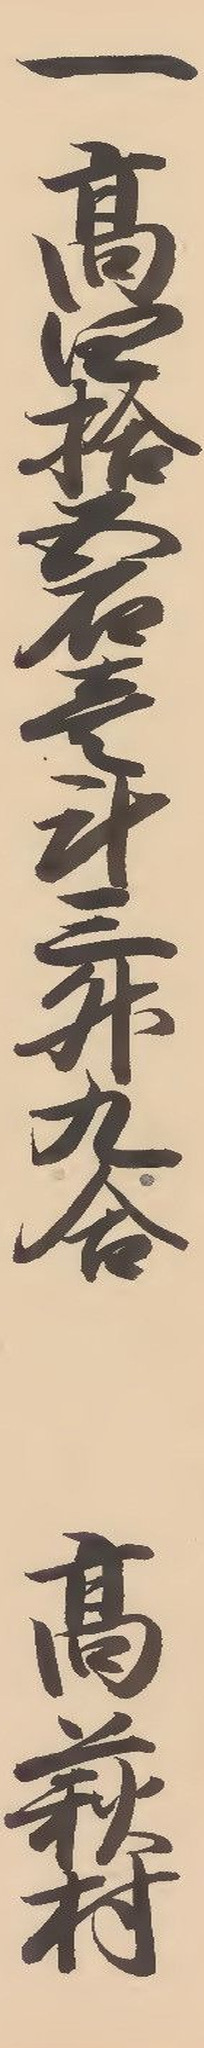一高四拾五石壱斗三升九合高萩村
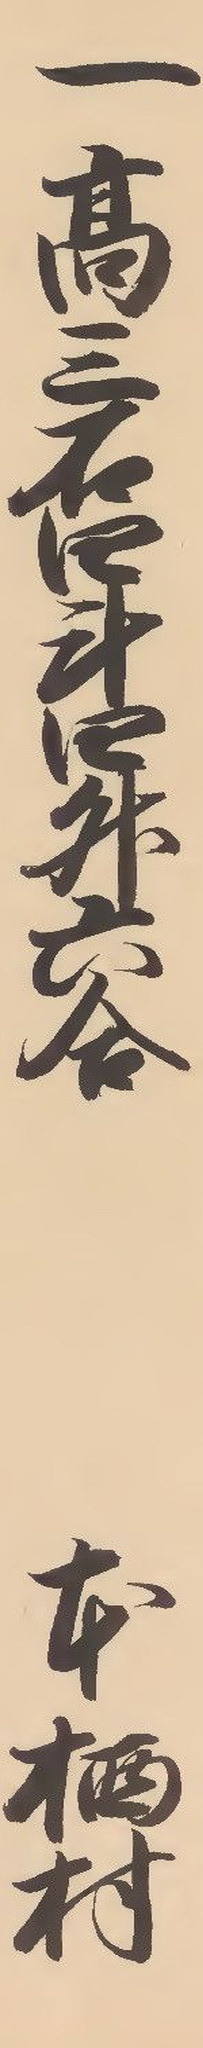一高三石四斗四升六合本栖村
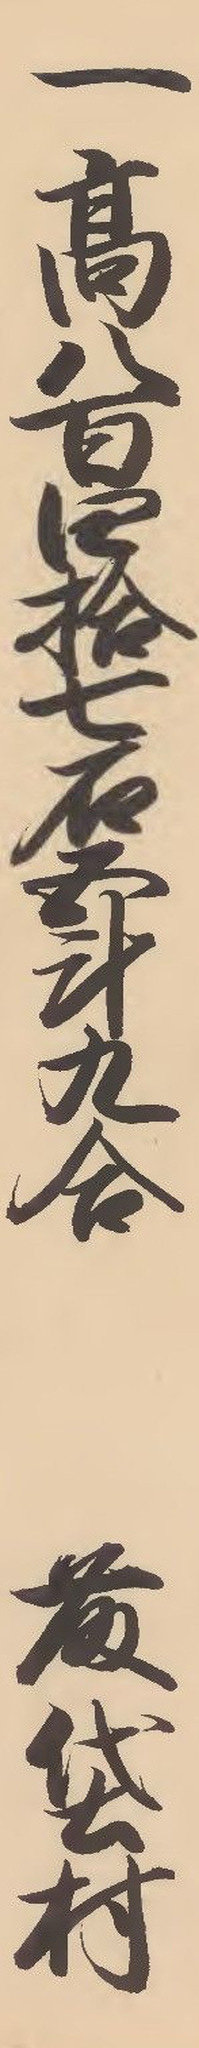一高八百四拾七石五斗九合藤袋村
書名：甲斐国郷帳
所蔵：国立公文書館 National Archives of Japan
